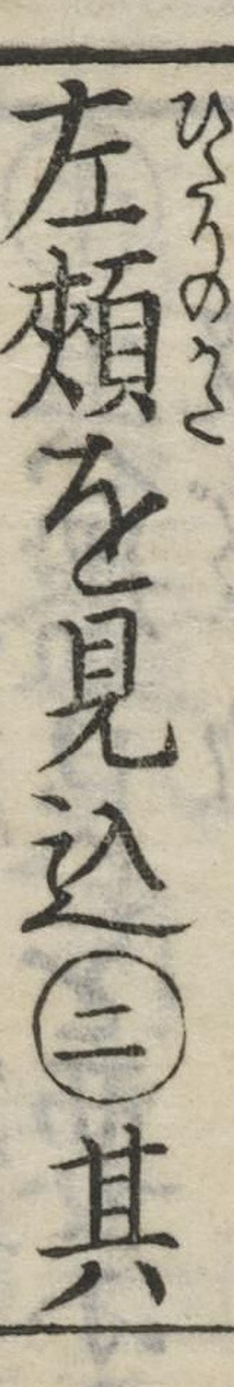左頬を見込㊁其
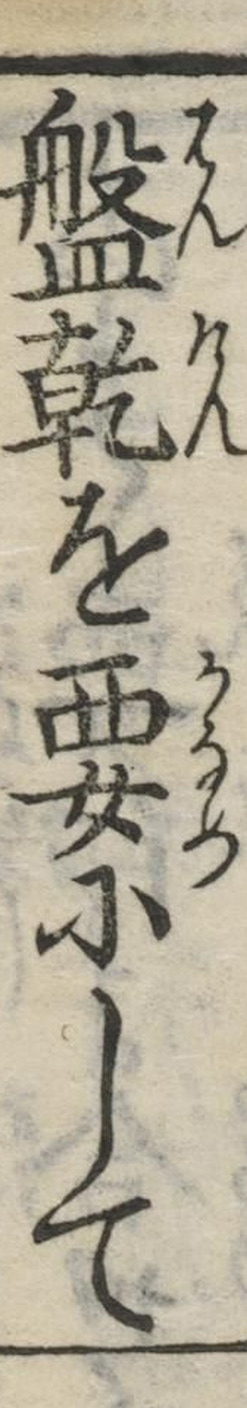盤乾を要にして
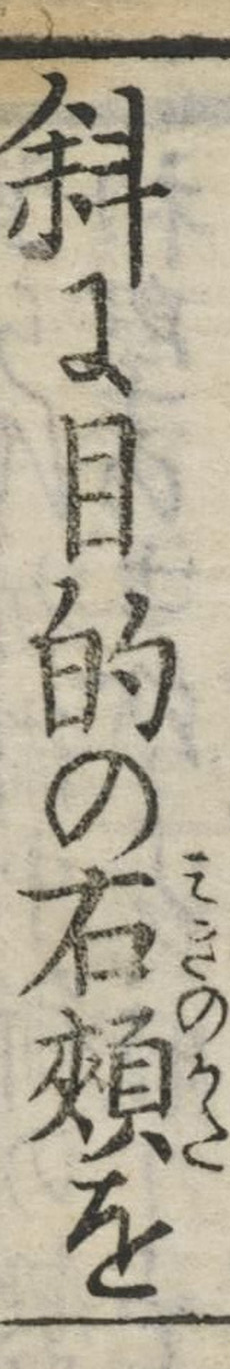斜に目的の右頬を
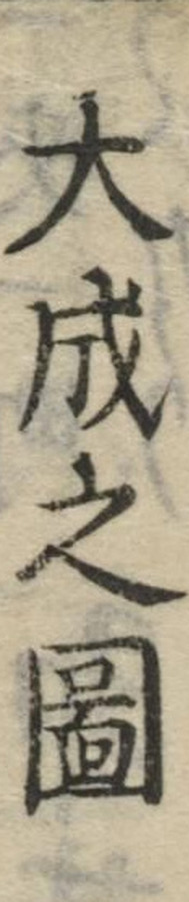大成之図
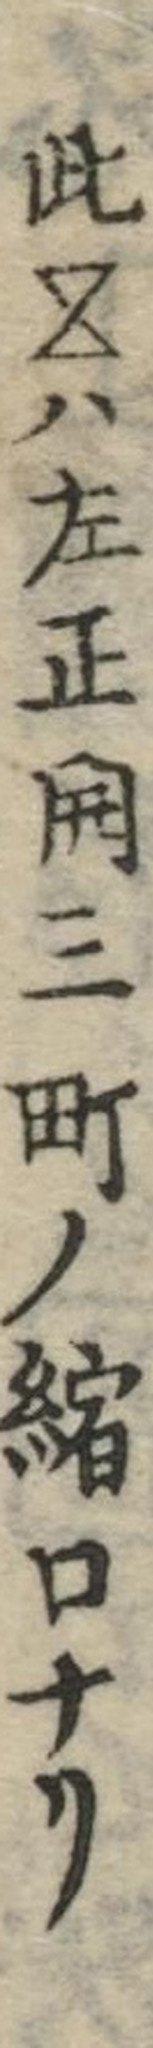此▽△ハ左正開三町ノ縮口ナリ
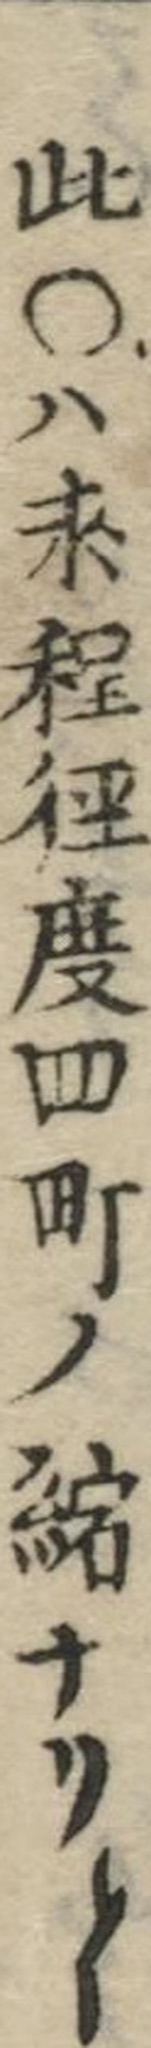此○ハ求程径度四町ノ縮ナリ
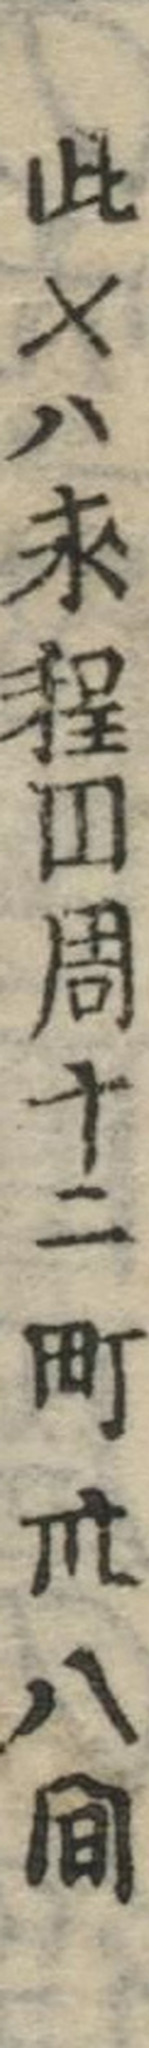此✕ハ求程円周十二町丗八間
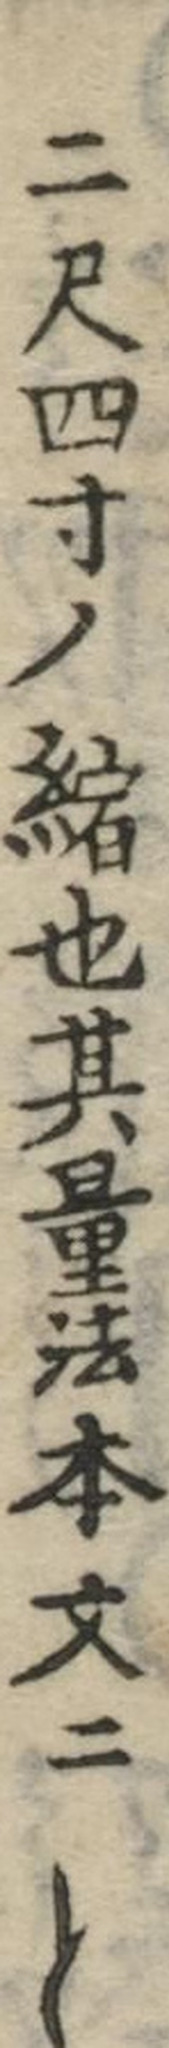二尺四寸ノ縮也其量法本文二
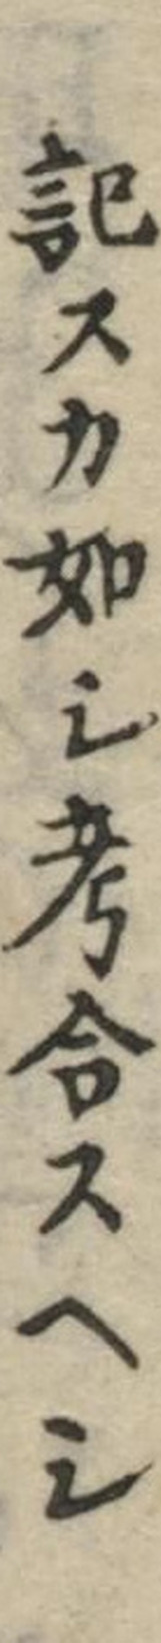記スか如シ考合スヘシ
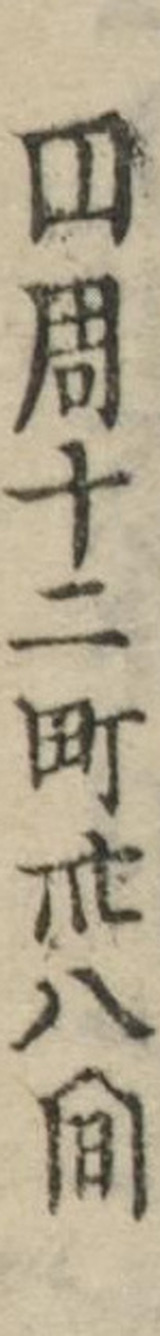円周十二町丗八間
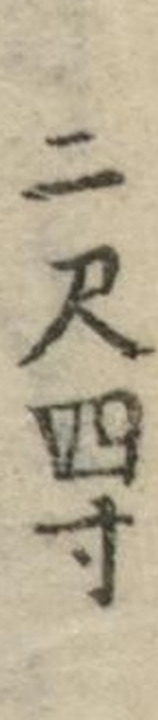二尺四寸

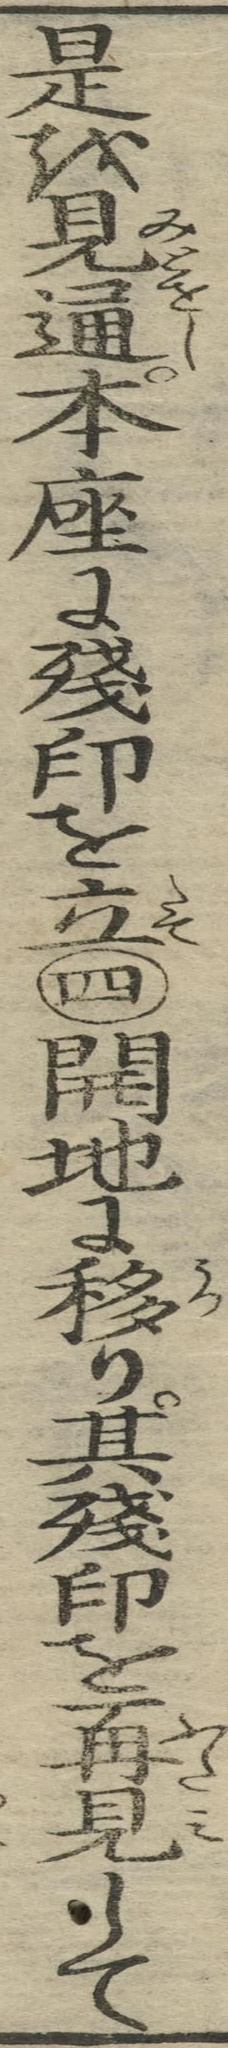是を見通。本座に残印を立㊃開地に移り。其残印を再見して
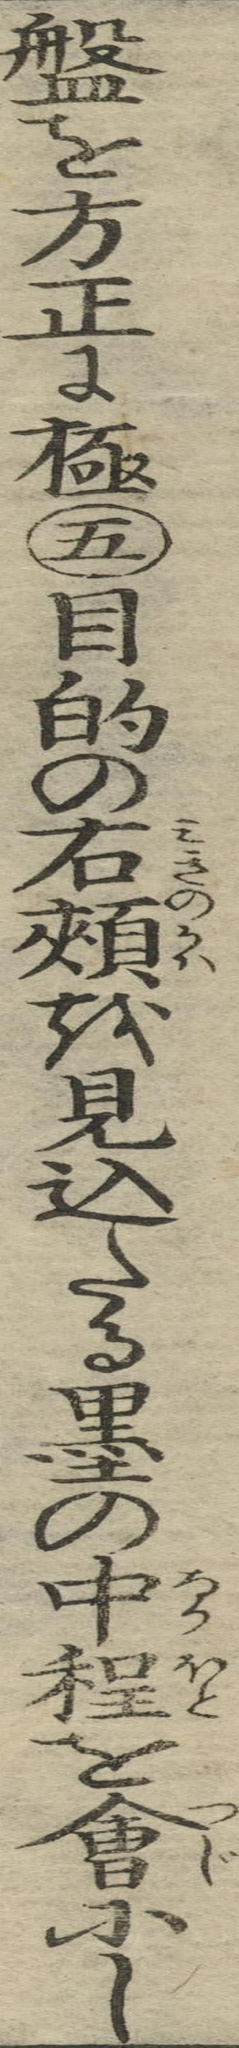盤を方正に極㊄目的の右頬を見込たる墨の中程を会にし
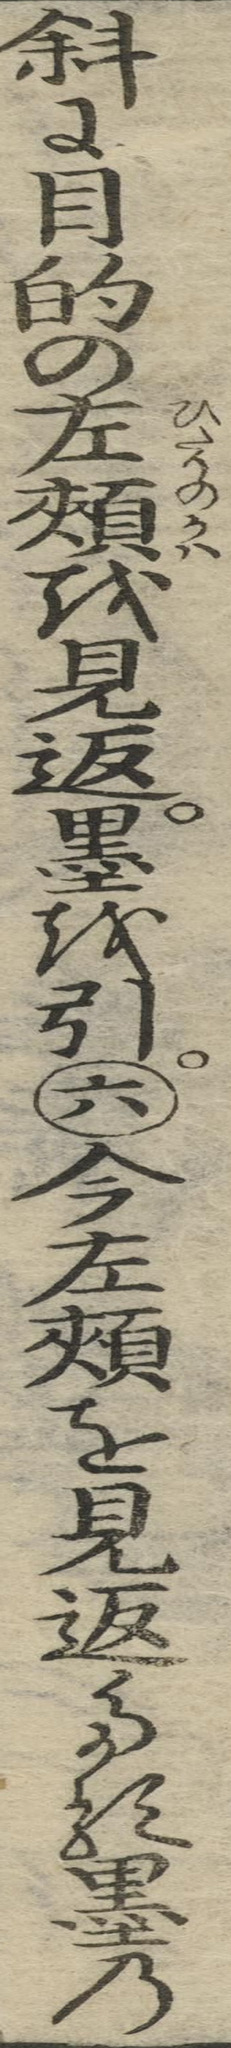斜に目的の左頬を見返。墨を引。㊅今左頬を見返たる墨の
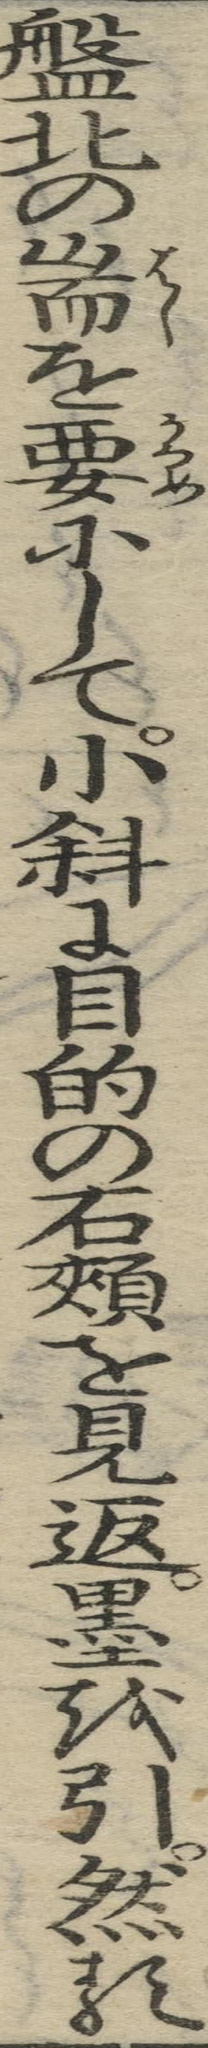盤北の耑を要にして。小斜に目的の右頬を見返。墨を引。然る
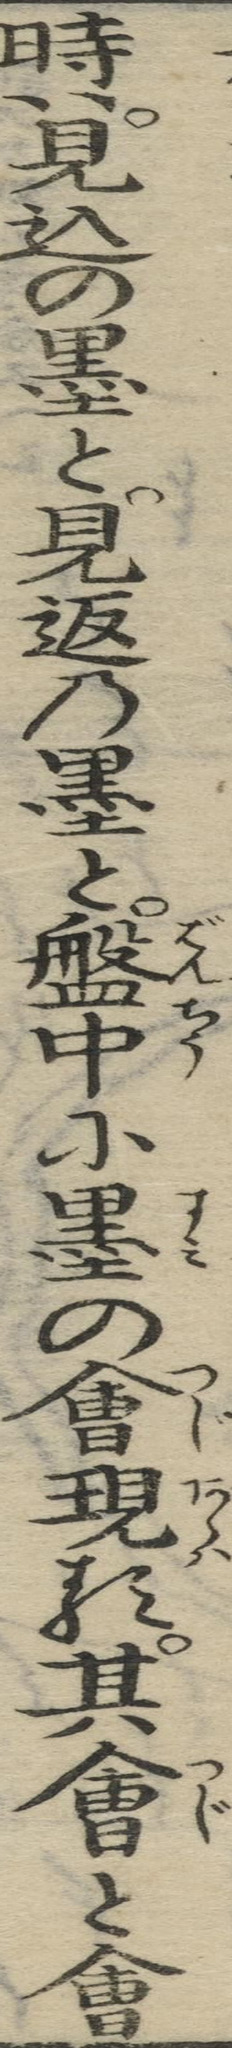時は。見込の墨と。見返の墨と。盤中に墨の会現る。其会と会
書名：量地指南　巻之三（内題）
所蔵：東京大学地震研究所図書室 Earthquake Research Institute Library, The University of Tokyo, JAPAN
